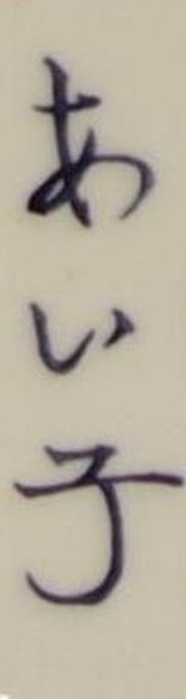あい子
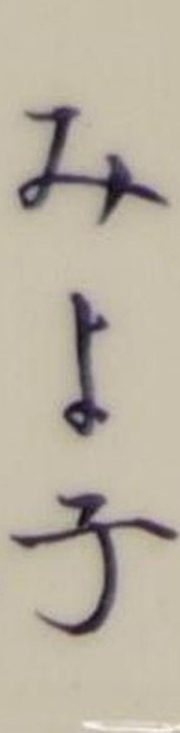みよ子
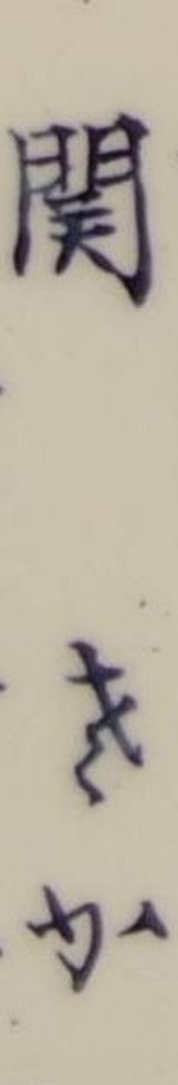関きか
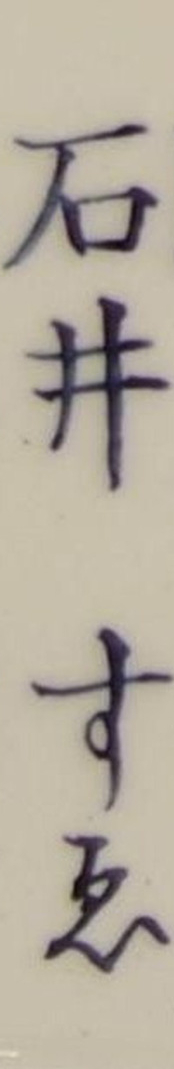石井すゑ
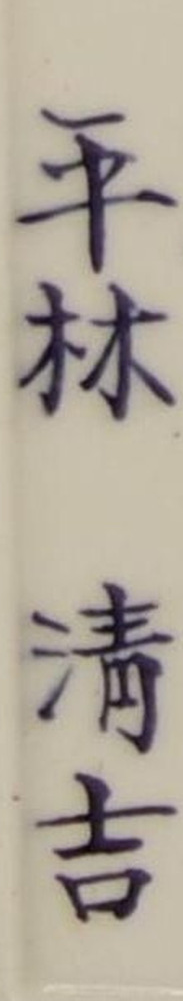平林清吉

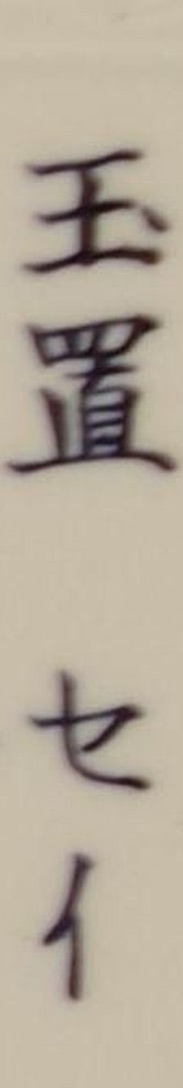玉置セイ
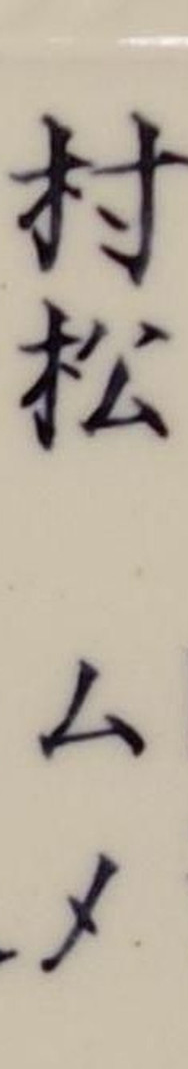村松ムメ
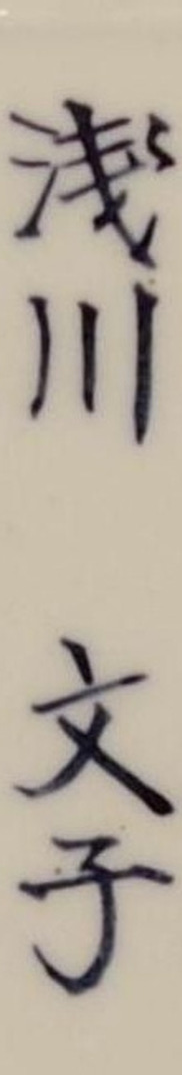浅川文子
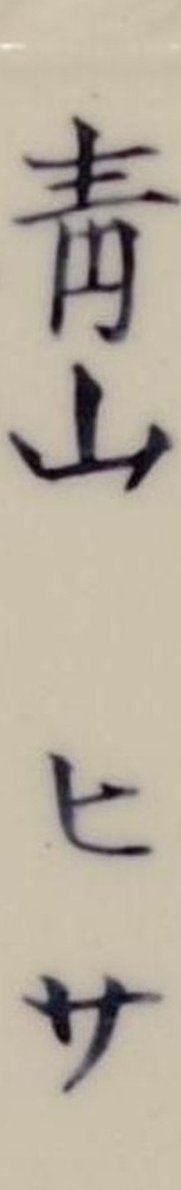青山ヒサ
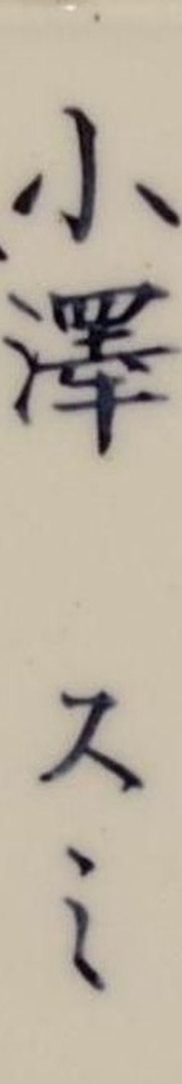小澤スミ
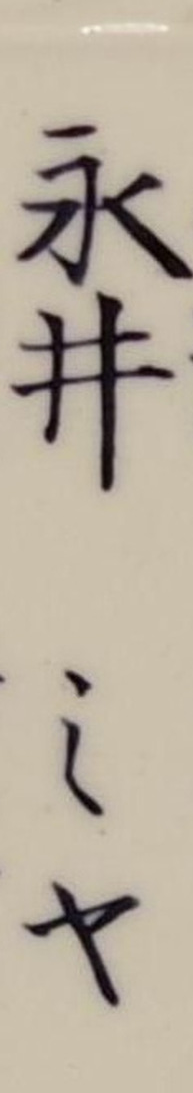永井ミヤ
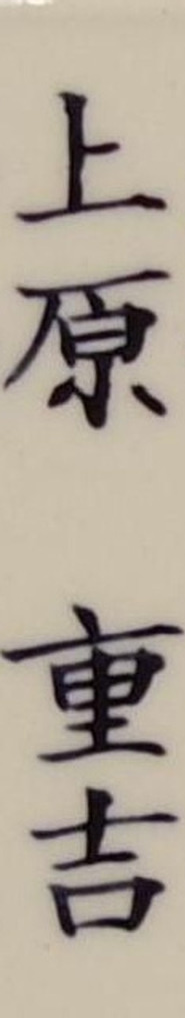上原重吉
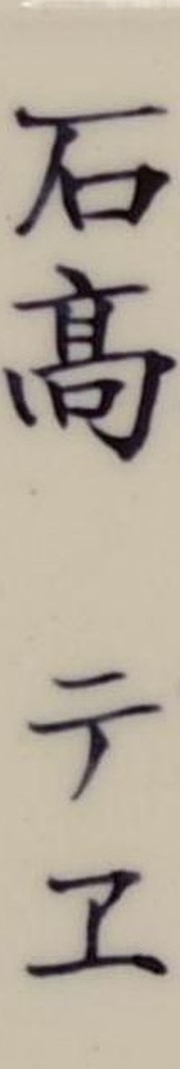石高テヱ
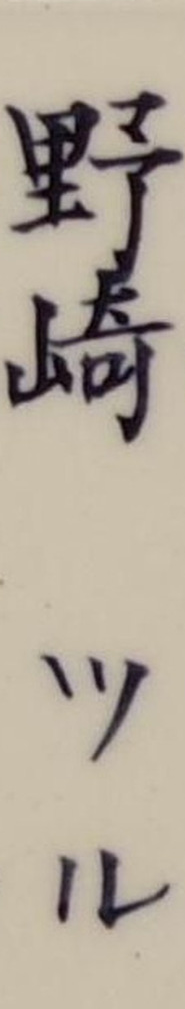野崎ツル
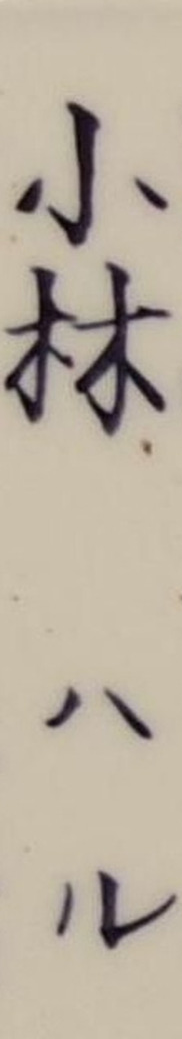小林ハル
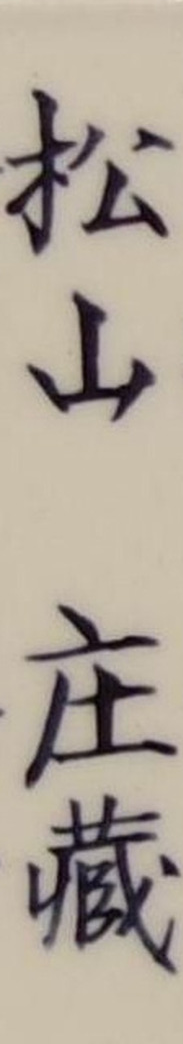松山庄蔵
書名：M~S
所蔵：高野山金剛峯寺
